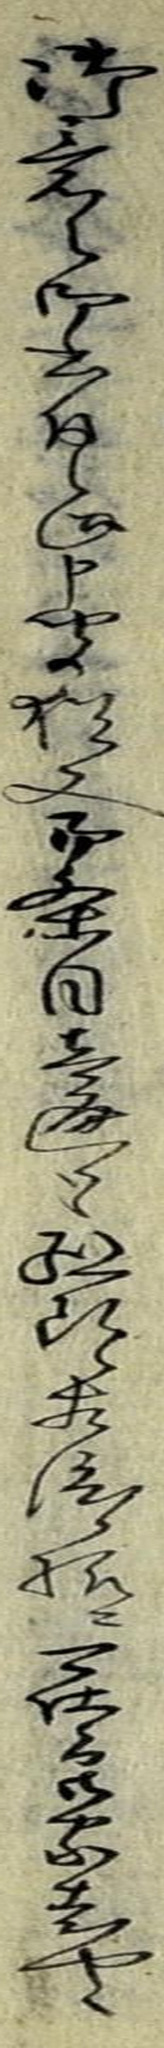御意之御書付之趣申聞猶又御条目壱通ツヽ組頭へ相渡候様ニ可仕旨御家老中へ
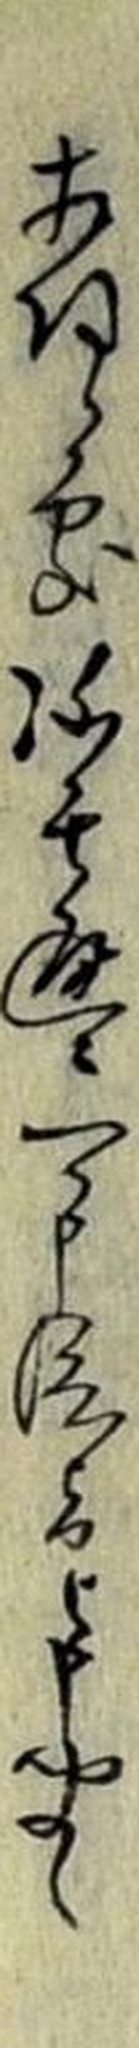相伺候処弥其通ニ可申渡旨被申聞候
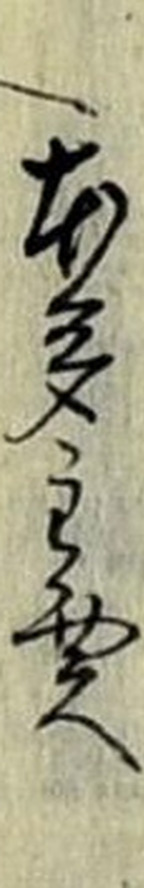本多主殿
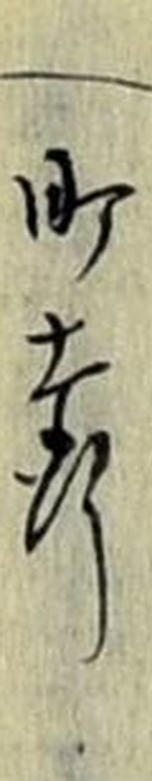町奉行
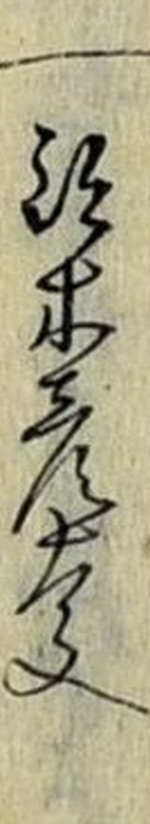鈴木彦大夫
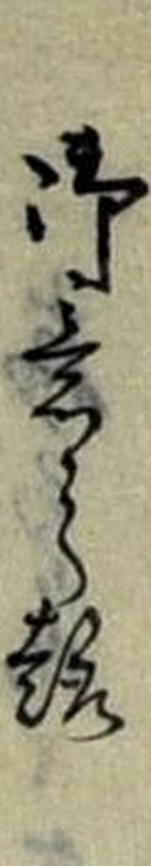御意之趣
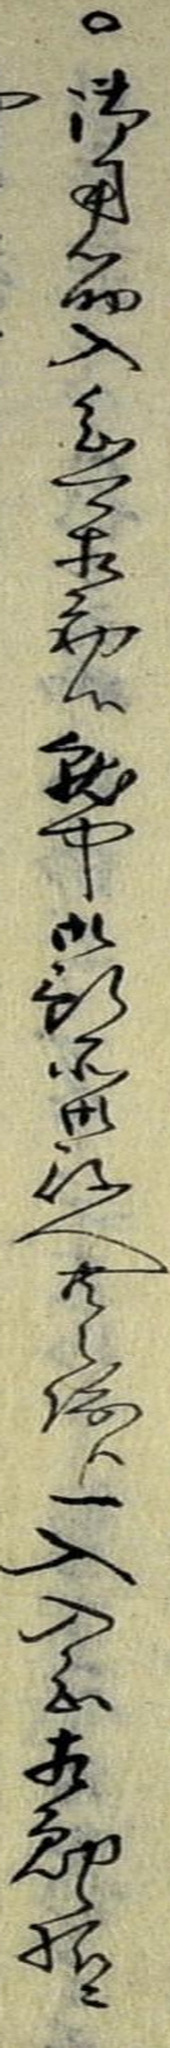〇御用筋入念可相勤候就中御預所御役人共之儀ハ一入入念相勤候様ニ
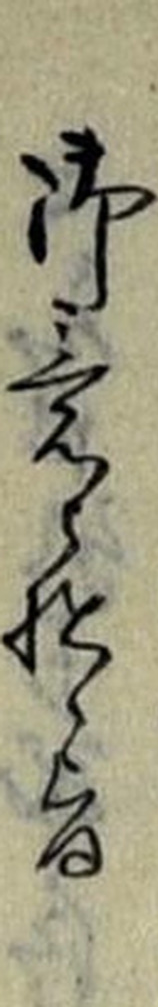御意被遊候旨
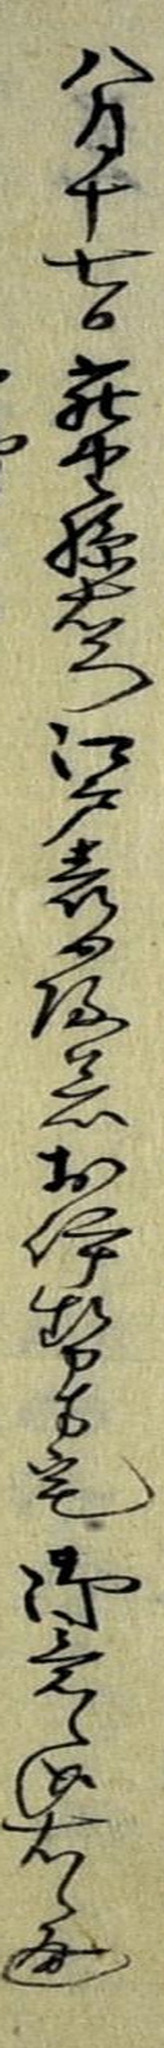八月十七日荻野孫右衛門江戸表ゟ帰着於伊勢方宅御意之趣右之通
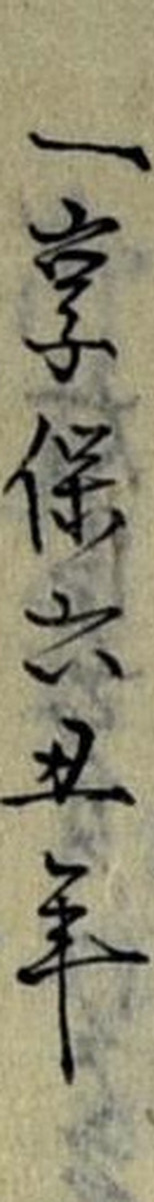一享保六丑年
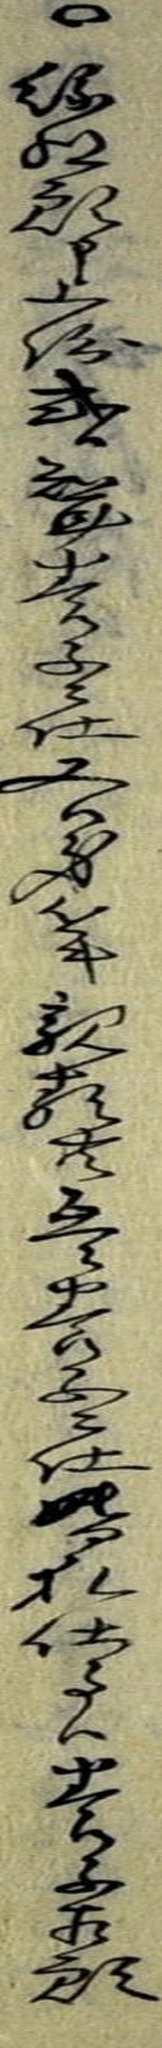〇縁組願申上儀或ハ聟養子ニ仕又ハ身近キ親類共互ニ養子ニ仕婚礼仕事ハ養子相願
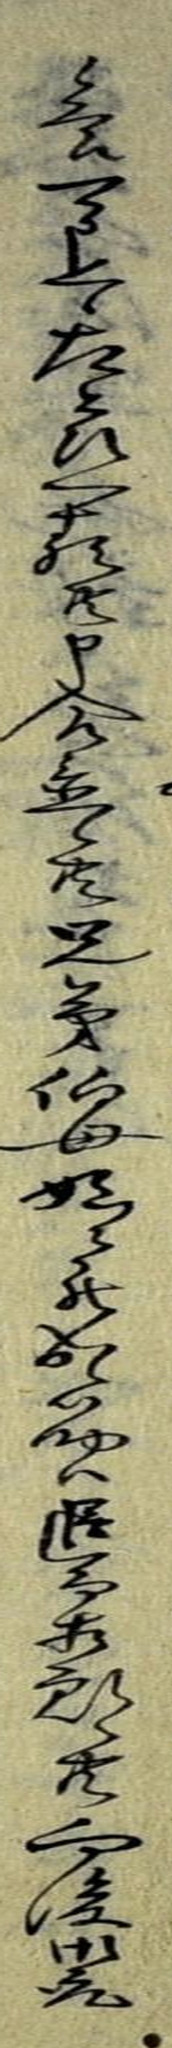候節可申上候たとひ一類共申合置候共兄弟伯母姪ニ罷成候筋ハ追而相願候共向後御取
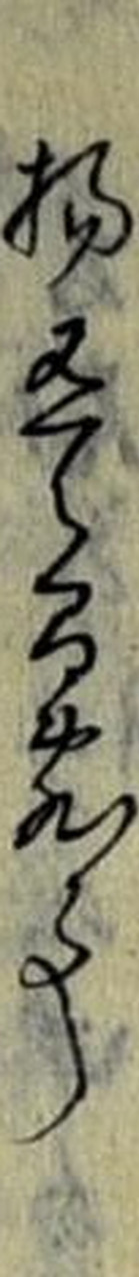揚有之間敷事
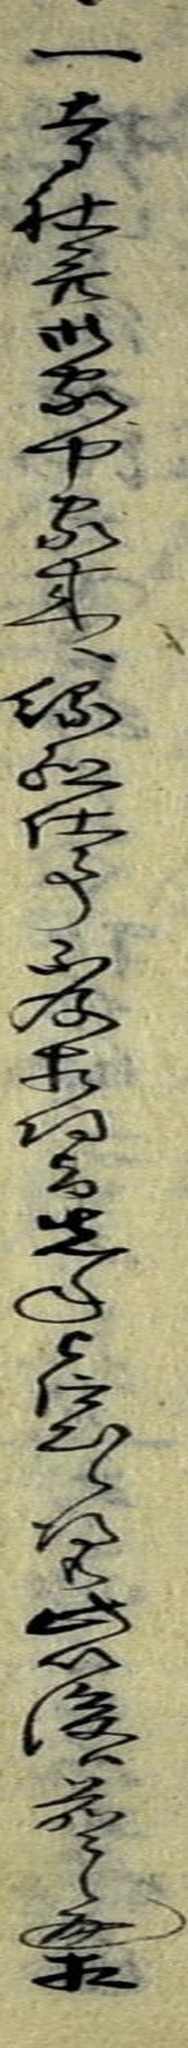一寺社并御家中家来へ縁組仕事不及相伺旨先年被仰出候得共此以後ハ前々之通相
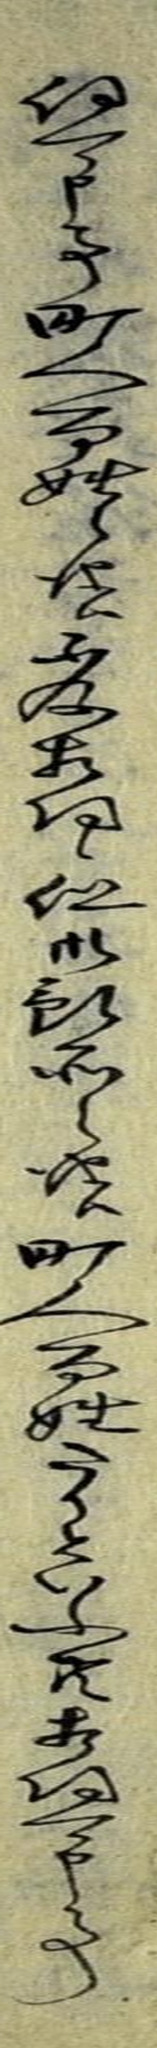伺可申事町人百姓之儀ハ不及相伺候但御預所之儀ハ町人百姓たりといふ共相伺可申事
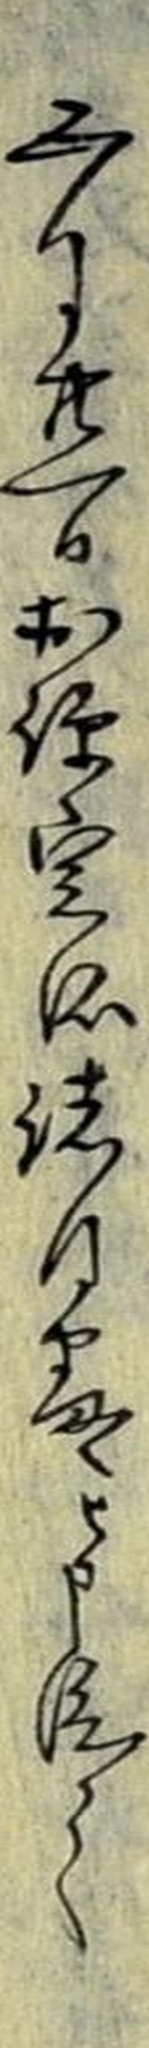五月廿一日於評定所諸月番へ被申渡之
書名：命令之部 一
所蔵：福井県文書館 Fukui Prefectural Archives
